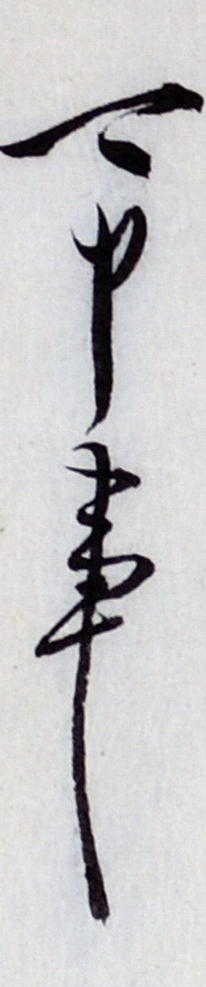可申事
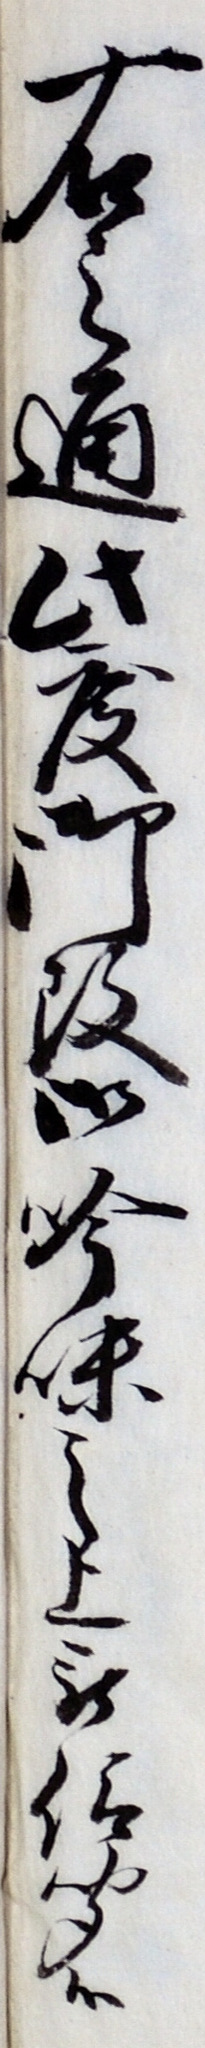右之通此度御改御吟味之上被仰聞候
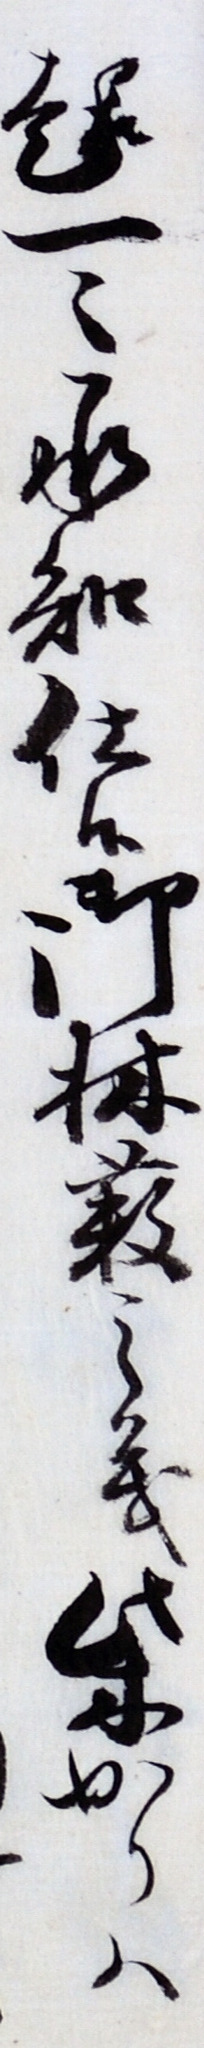趣一々承知仕候御林薮之義柴かりハ
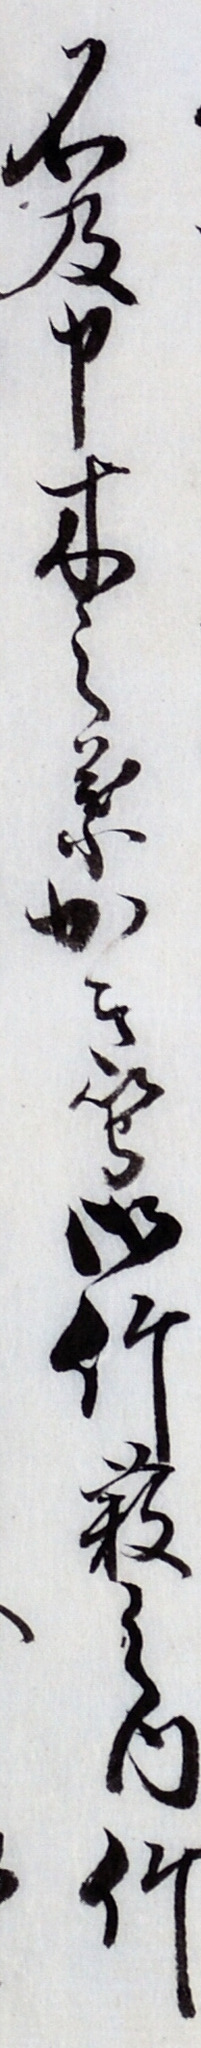不及申木之葉かき等御竹薮之内竹
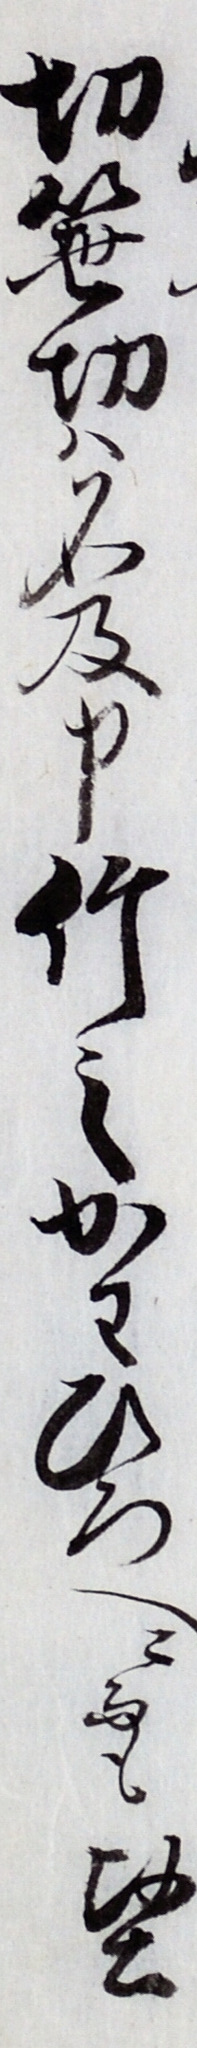切笹切ハ不及申竹之かわひろへニ而も堅
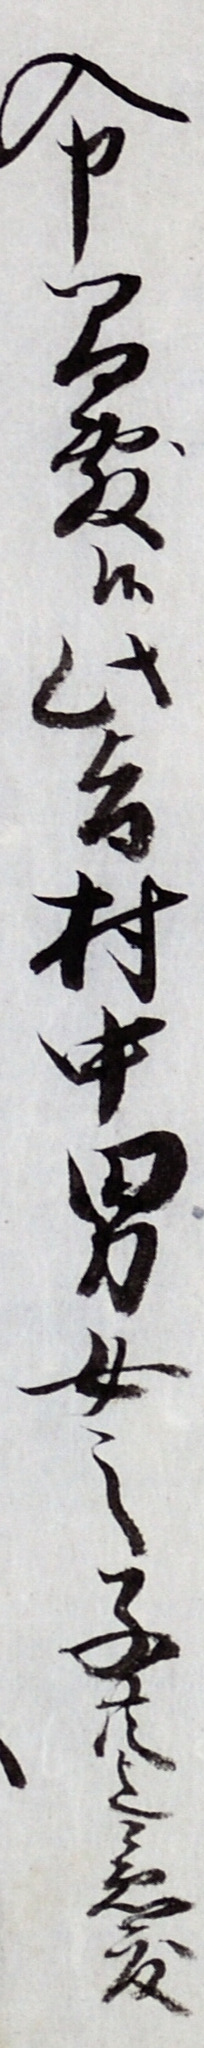入申間敷候此旨村中男女之子共迄急度
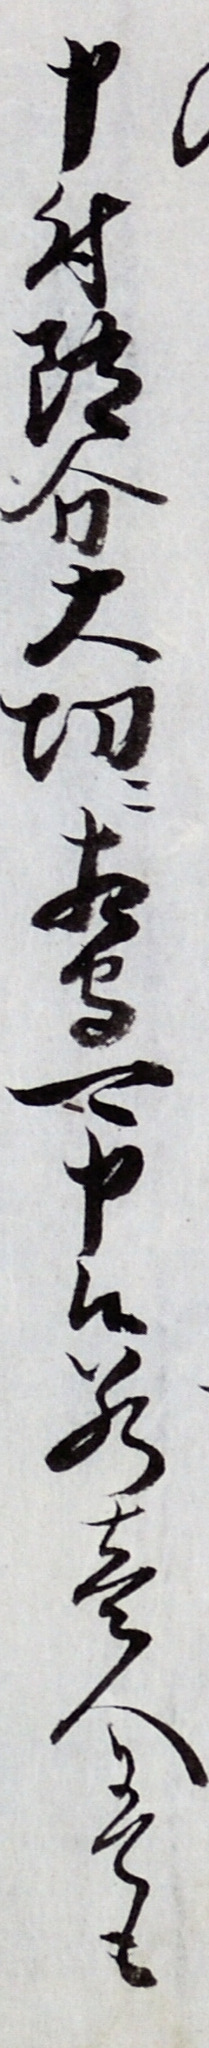申付随分大切ニ相守可申候若壱人にても
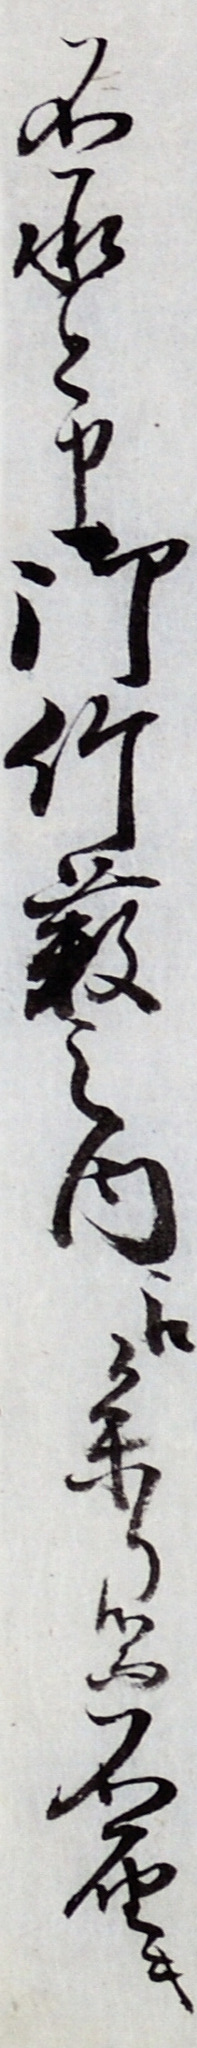不承と申御竹薮之内え参り候而不届キ
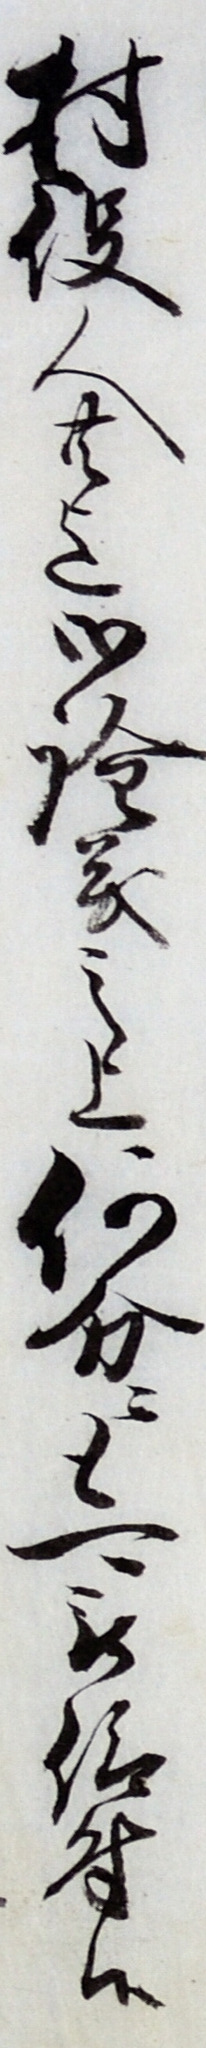村役人共迄御詮義之上何分ニも可被仰付候
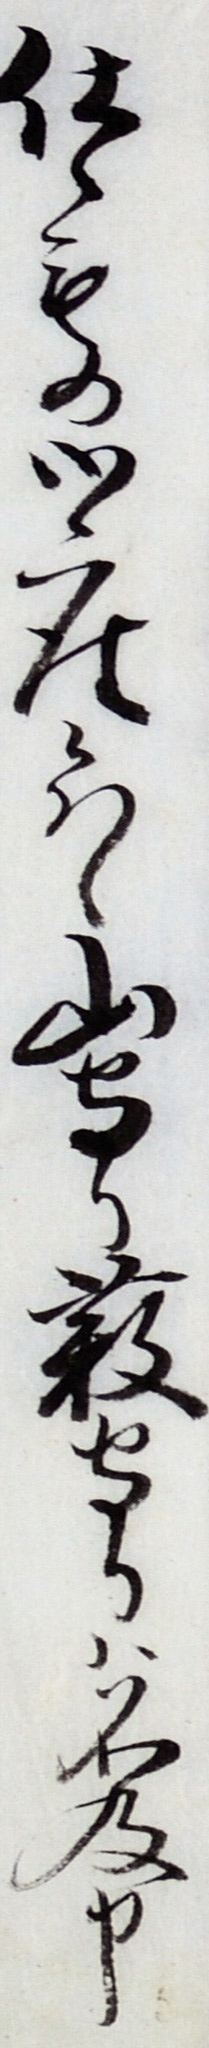仕候もの御座候ハヽ山守り薮守りハ不及申

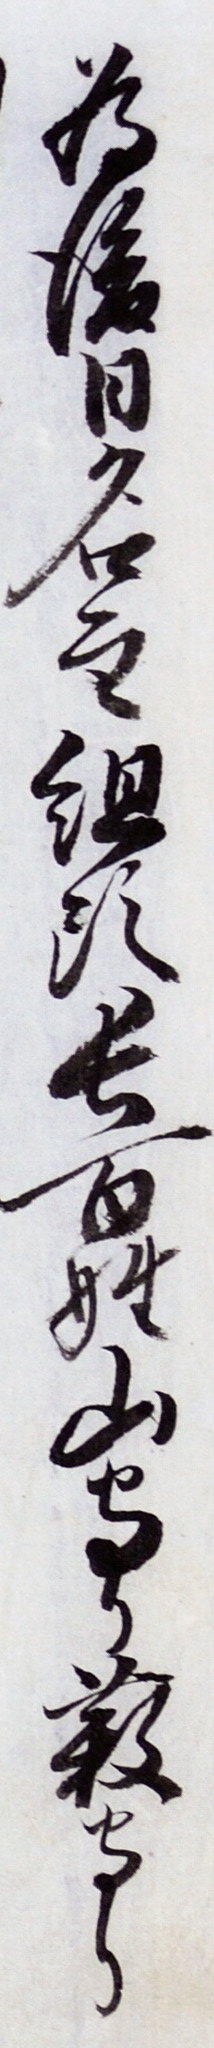為後日名主組頭長百姓山守り薮守り
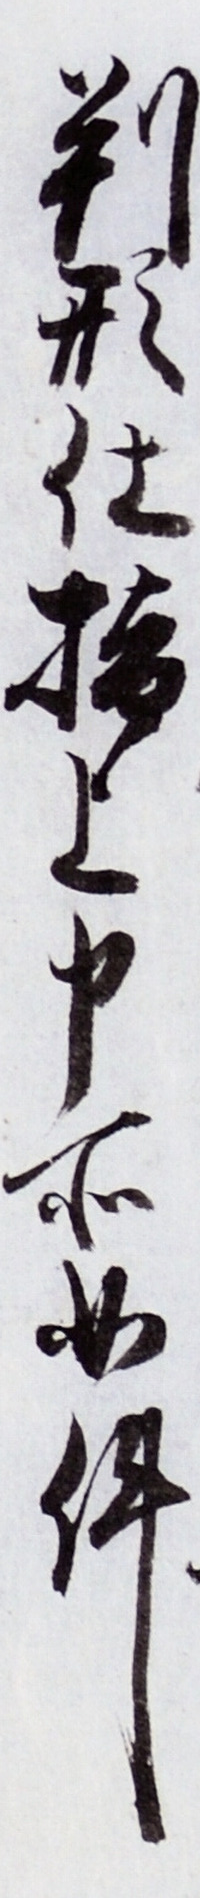判形仕指上申所如件
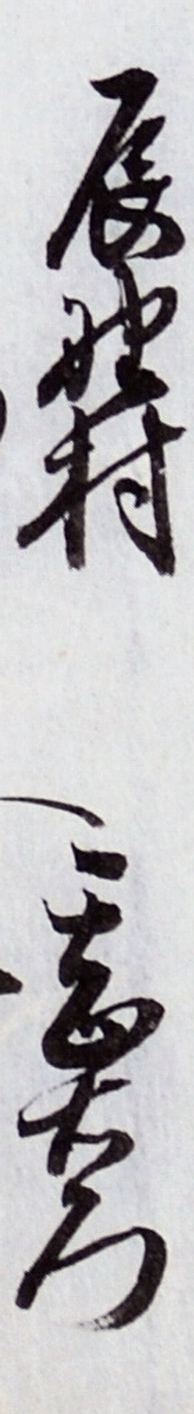辰野村甚右衛門
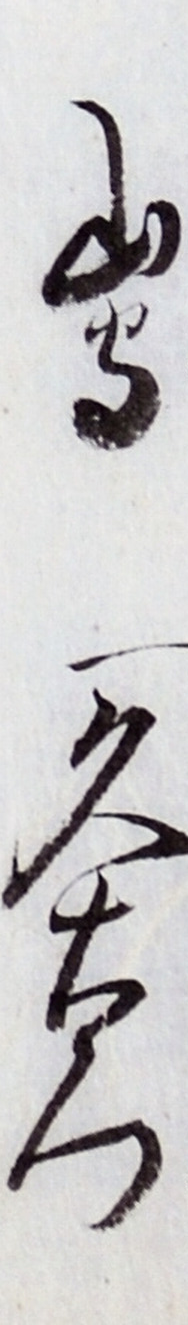同断久右衛門
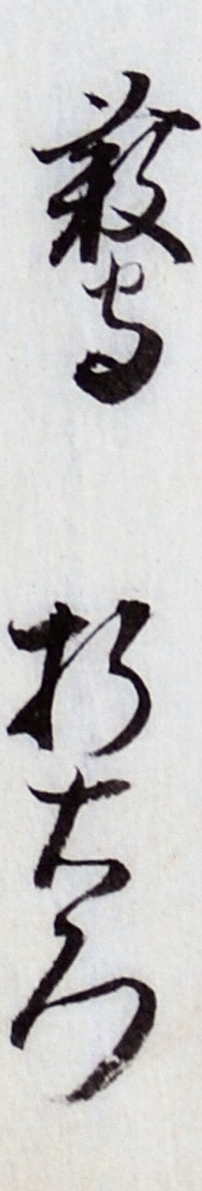薮寺折右衛門
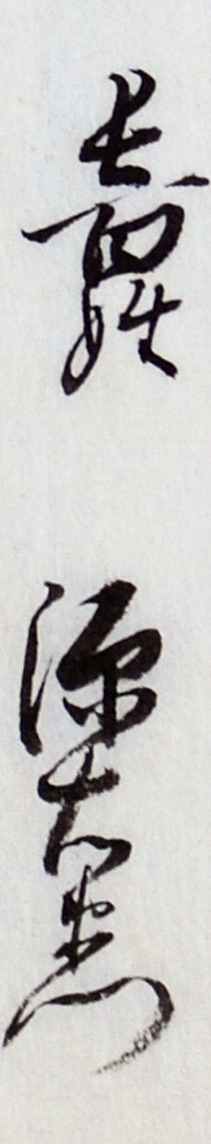長百姓源右衛門
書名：御林御竹藪証文控
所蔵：伊那市立高遠町図書館・合同会社AMANE
